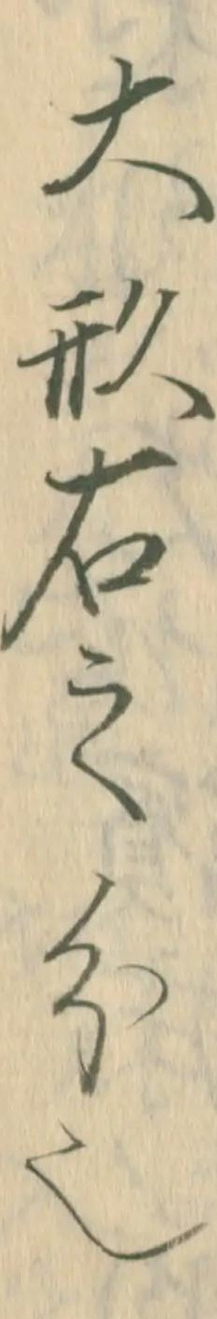大形右之分也

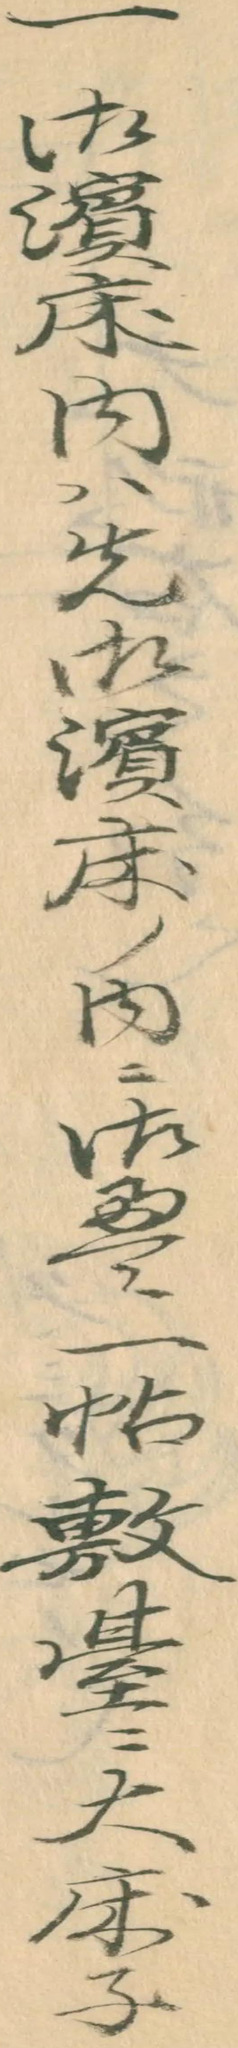一御浜床内ハ先御浜床ノ内ニ御畳一帖敷台ニ大床子
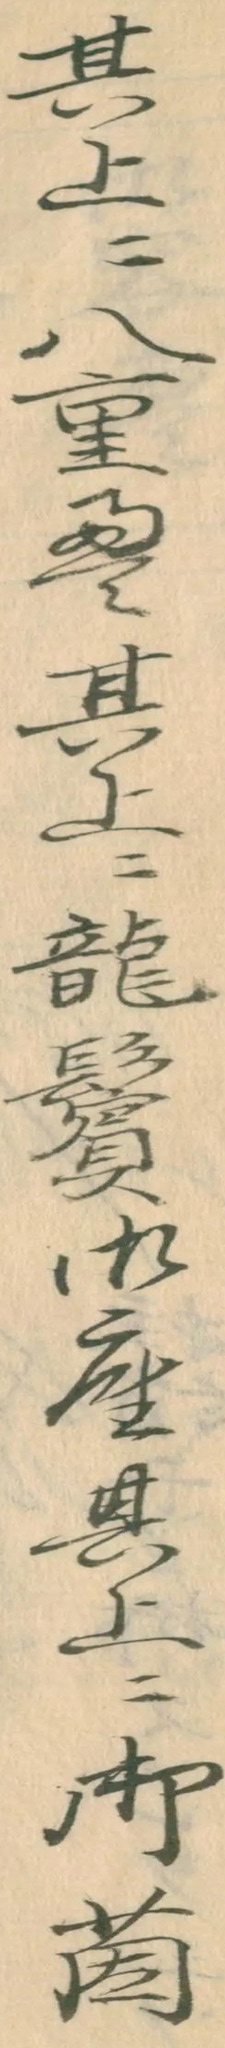其上ニ八重畳其上ニ龍鬢御座其上ニ御茵
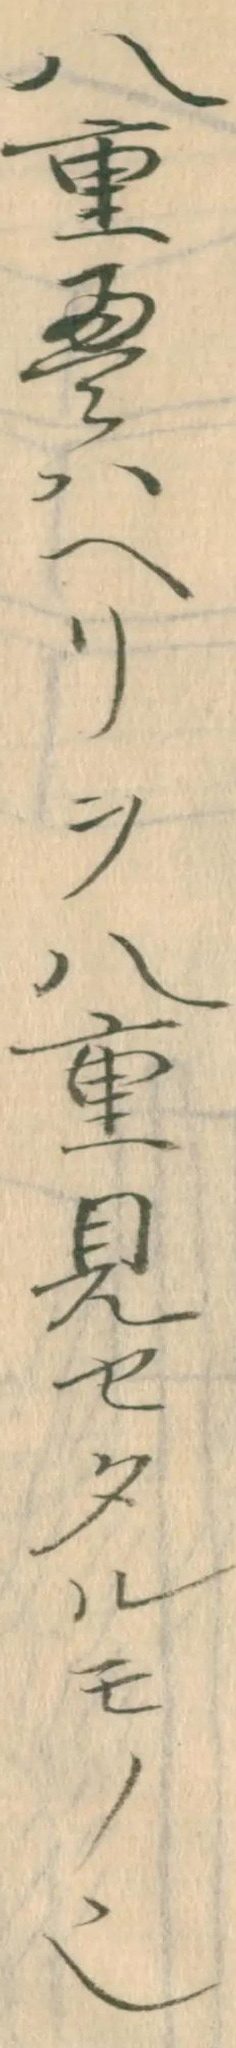八重畳ハヘリヲ八重見セタルモノ也
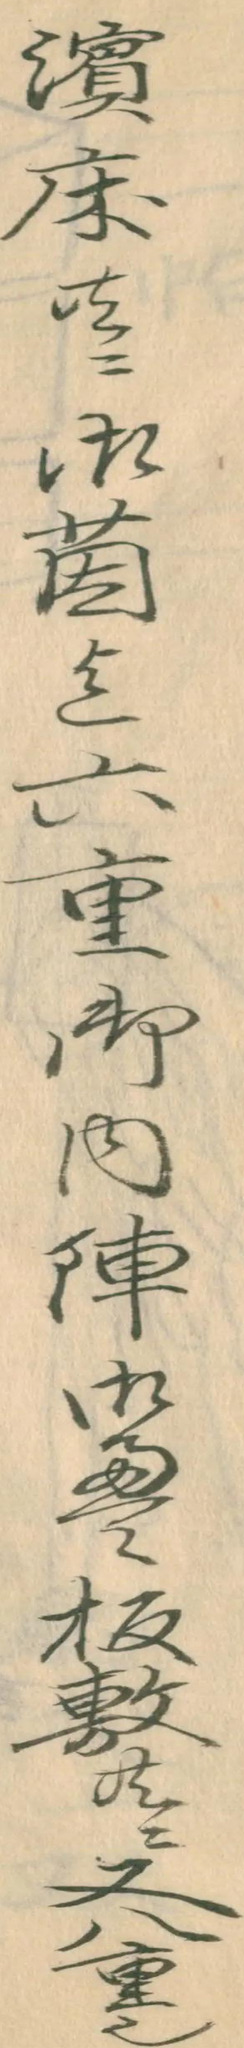浜床共ニ御茵迄六重御内陣御畳板敷共ニ又八重也
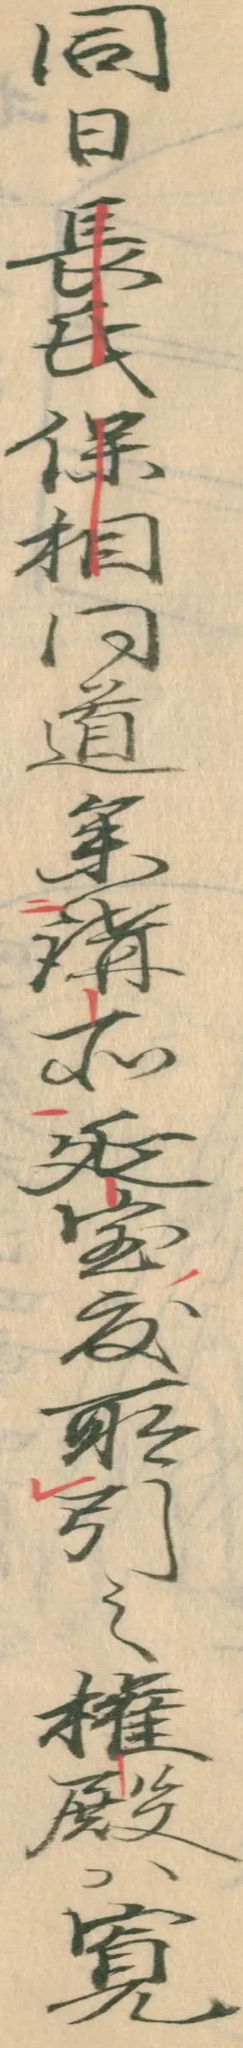同日長氏保相同道参講-所延-宝度取引之権-殿ハ寛
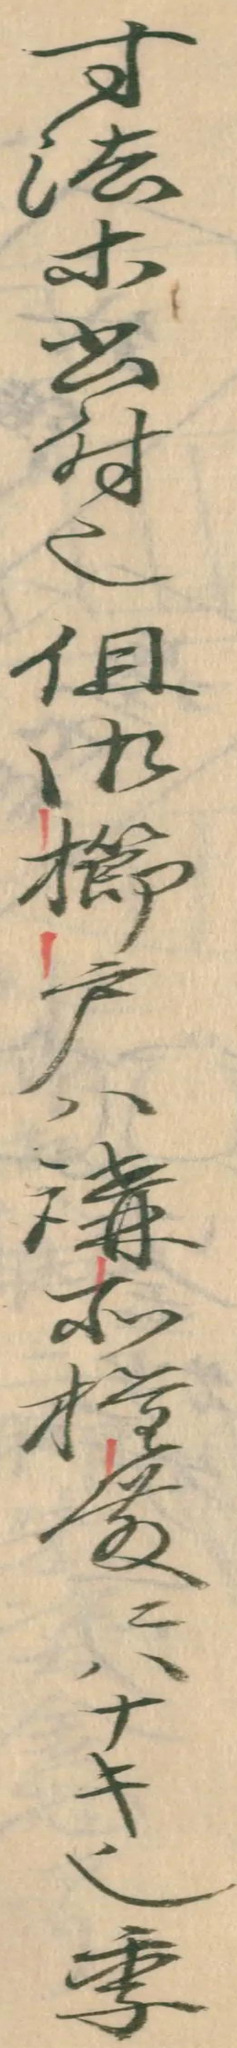寸法等書付也但御_櫛_戸ハ講-所権-殿ニハナキ也季
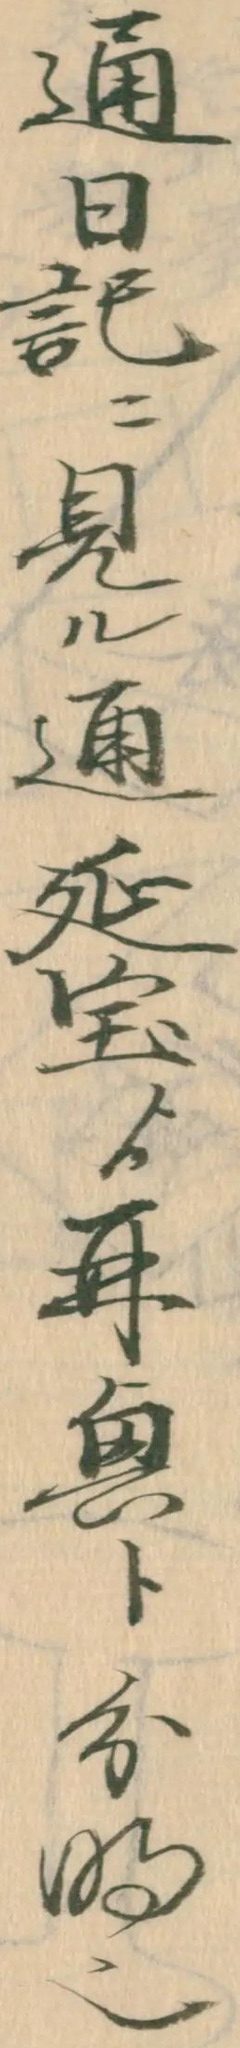通日記ニ見ル通延宝ゟ再興ト分明也

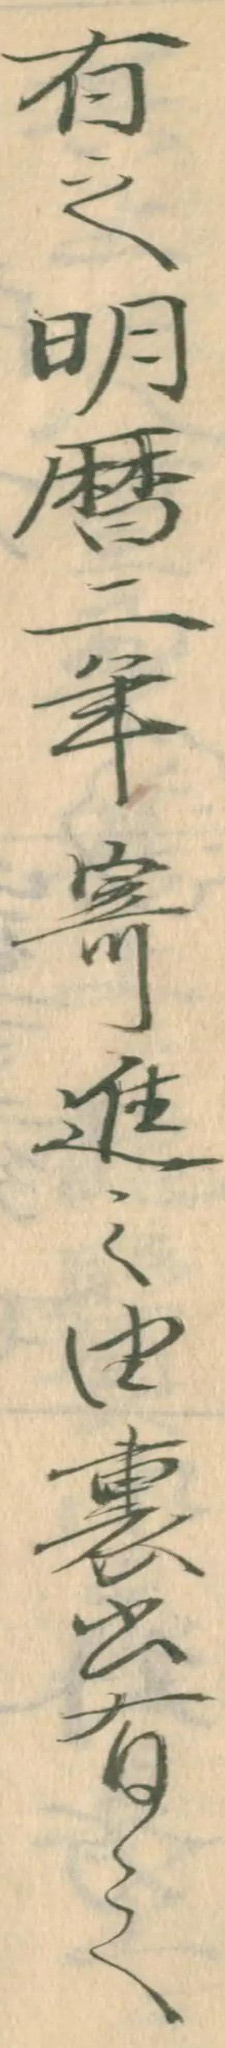有之明暦二年寄進之由裏書有之
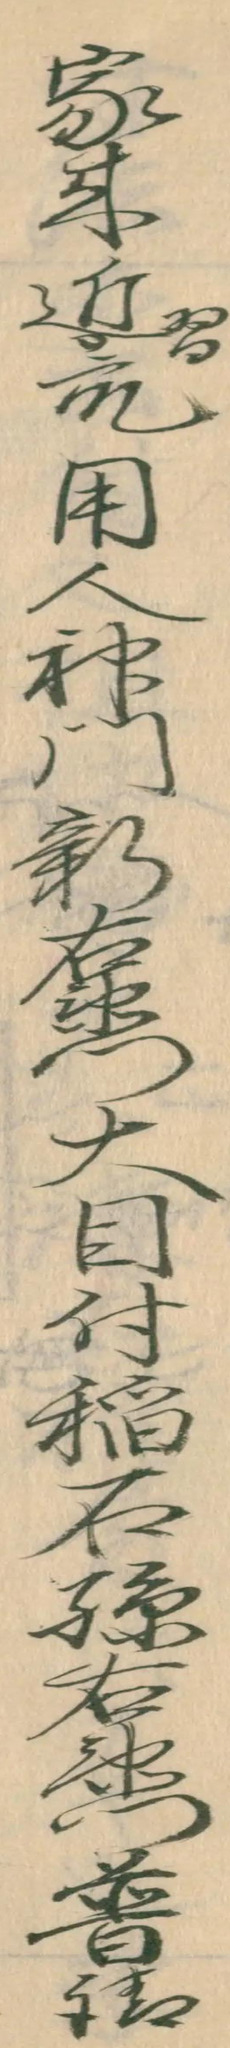家来近￮衆用人神門新右衛門大目付稲石孫右衛衛門普請
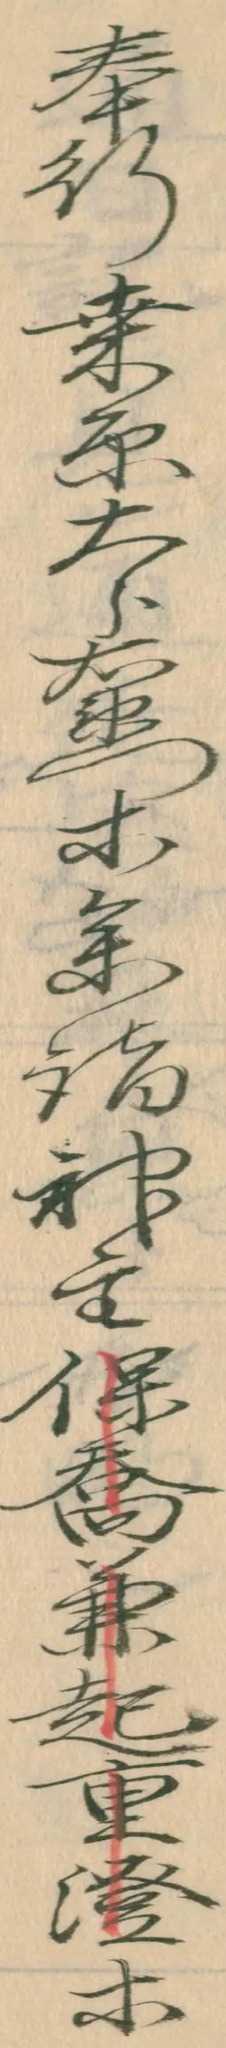奉行桒原大郎右衛門等参詣神主保喬兼起重澄等
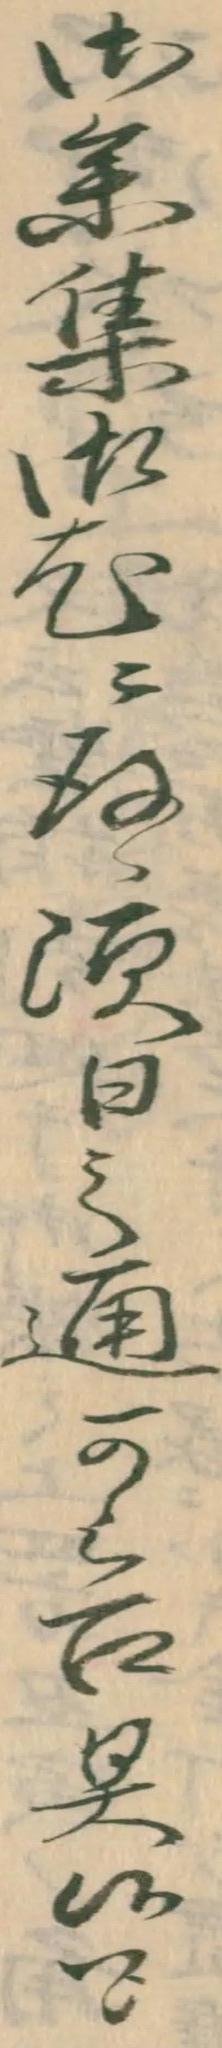御参集御尤ニ存候頃日之通可被召具候以上
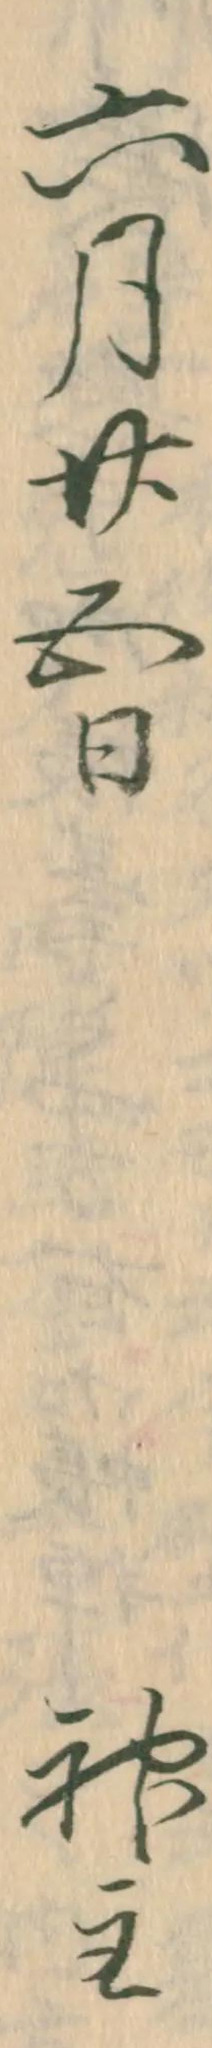六月廿五日神主
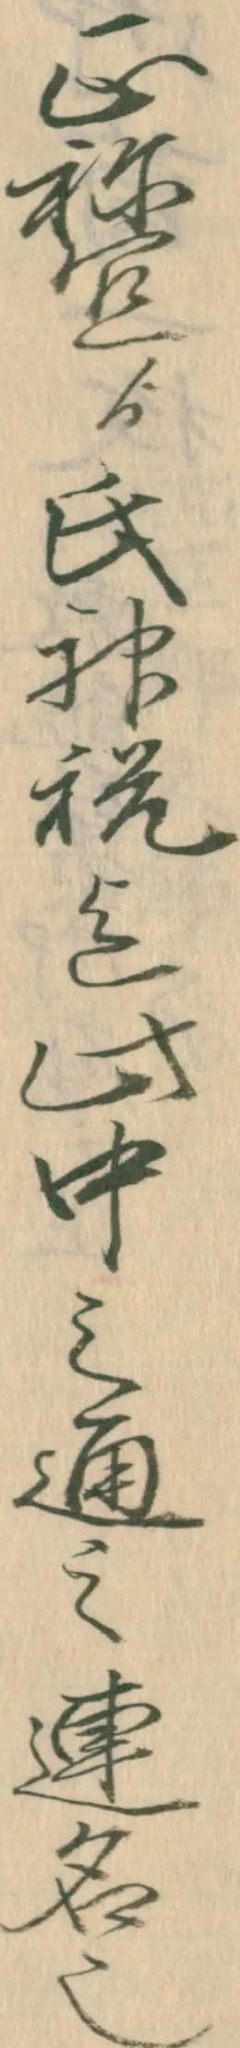正祢宜ゟ氏神祝迄此中之通之連名也
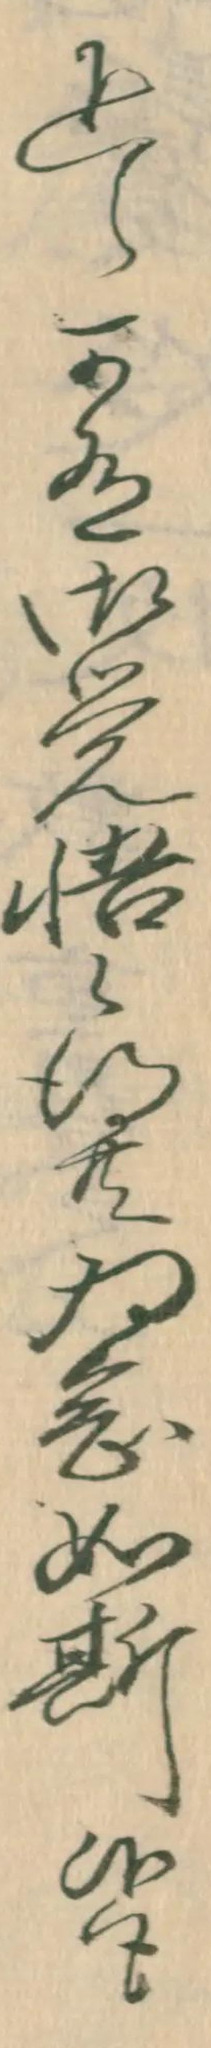追々可有御覚悟候得共為念如斯候以上

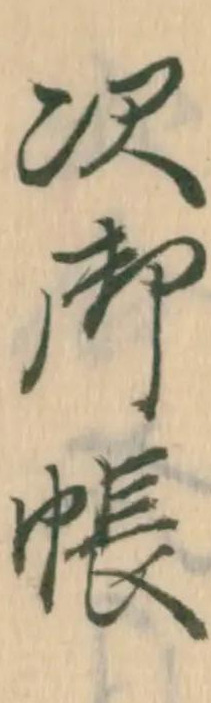次御簾
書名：賀茂社記録. 第15冊
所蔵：国立国会図書館 National Diet Library, JAPAN
